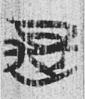是
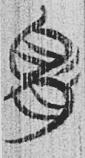{胃刀}（謂）
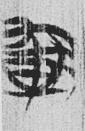軍
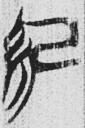紀
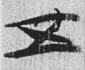五
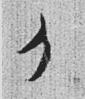人
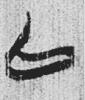㠯
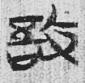○（伍）
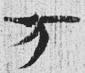万人
